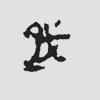{豆戈}
